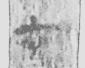七十
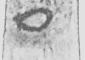四
